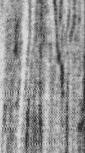賓
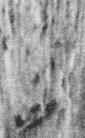客
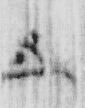之
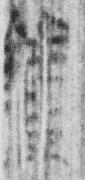豊（禮）
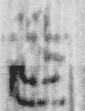必
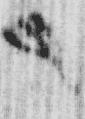又（有）
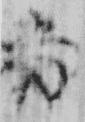夫
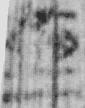齊齊
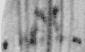之
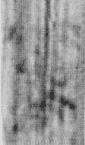頌（容）
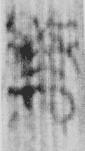祭
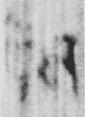祀
